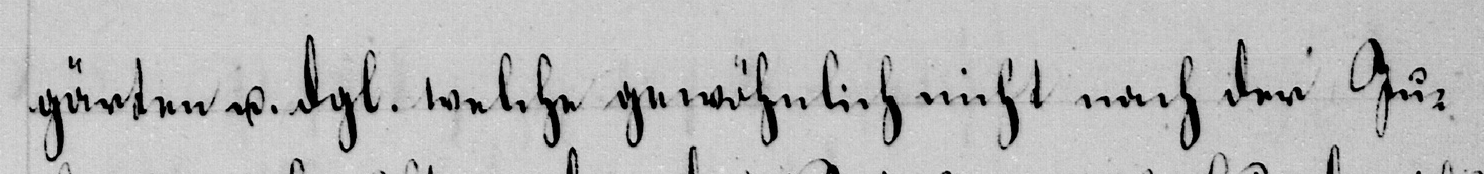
gärten u. dgl. welche gewöhnlich nicht nach der Ju¬
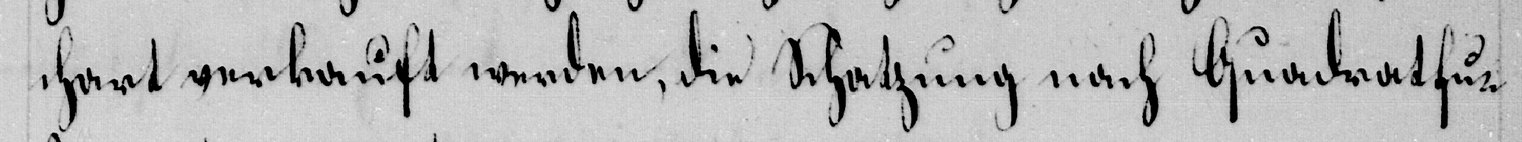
chart verkauft werden, die Schatzung nach Quadratfu¬
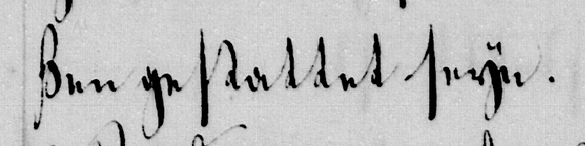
ßen gestattet seyn.
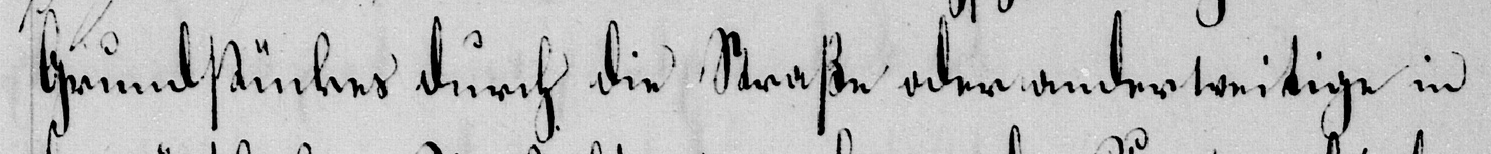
Grundstückes durch die Straße oder anderweitige in
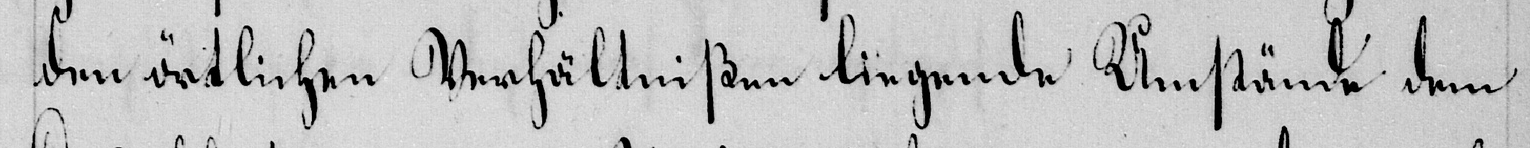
den örtlichen Verhältnißen liegende Umstände dem
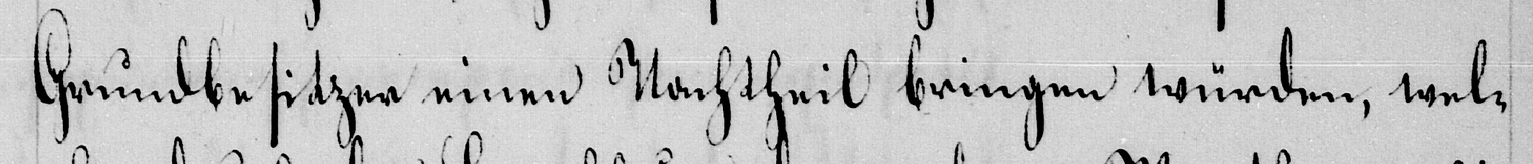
Grundbesitzer einen Nachtheil bringen würden, wel¬
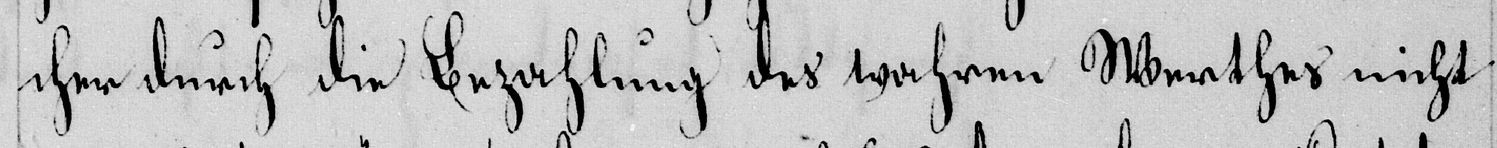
cher durch die Bezahlung des wahren Werthes nicht
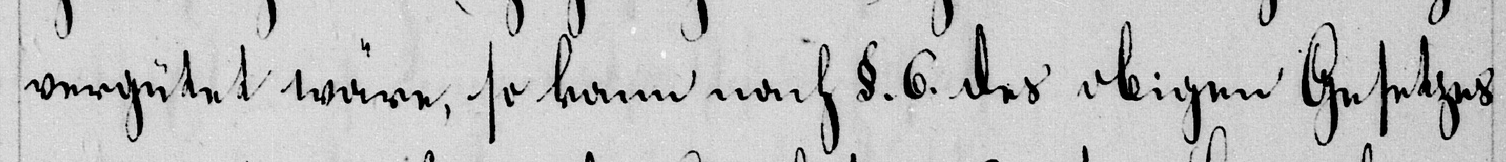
vergütet wären, so kann nach §. 6. des obigen Gesetzes
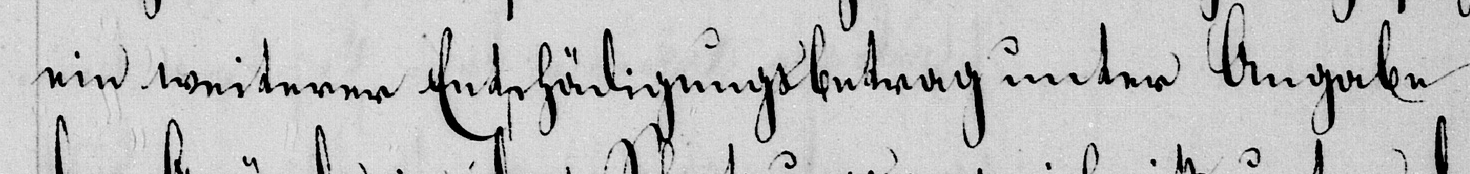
ein weiterer Entschädigungsbetrag unter Angabe
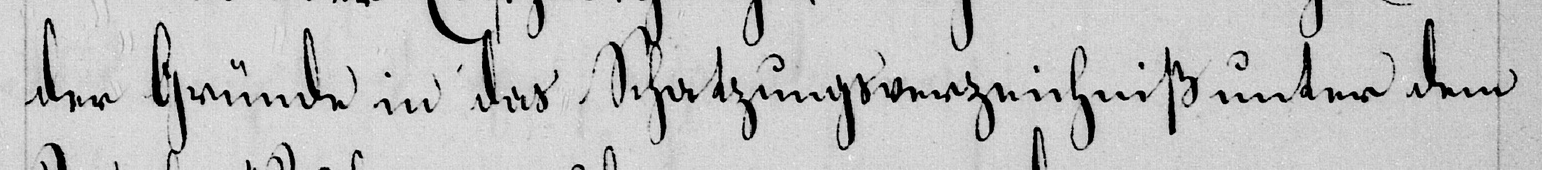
der Gründe in das Schatzungsverzeichniß unter dem
